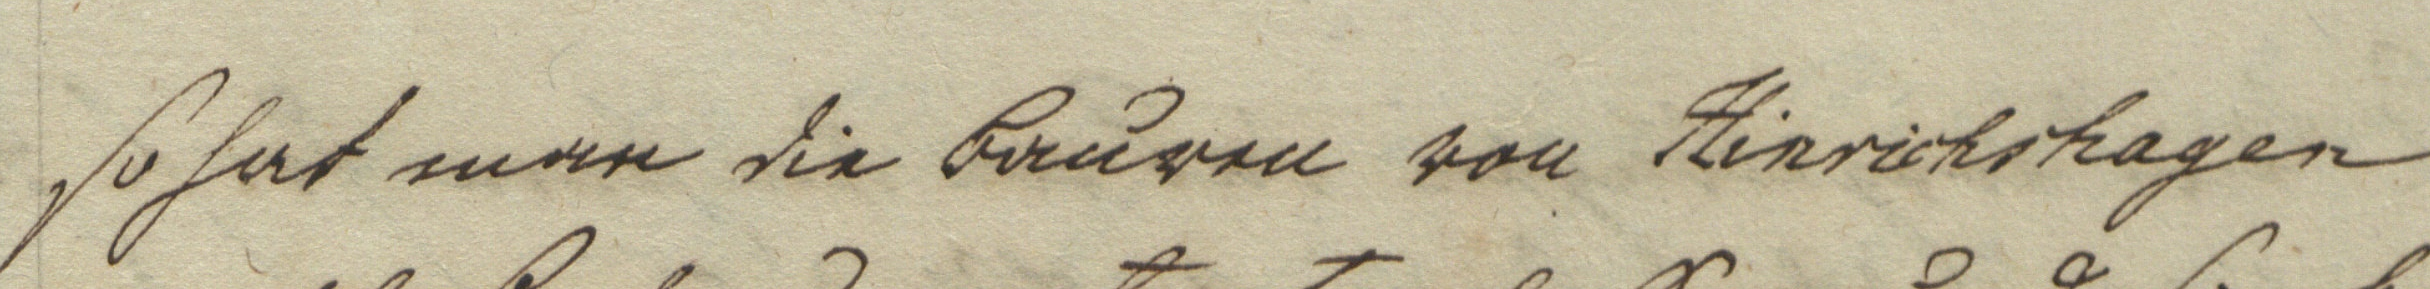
so hat man die Bauren von Hinrichshagen
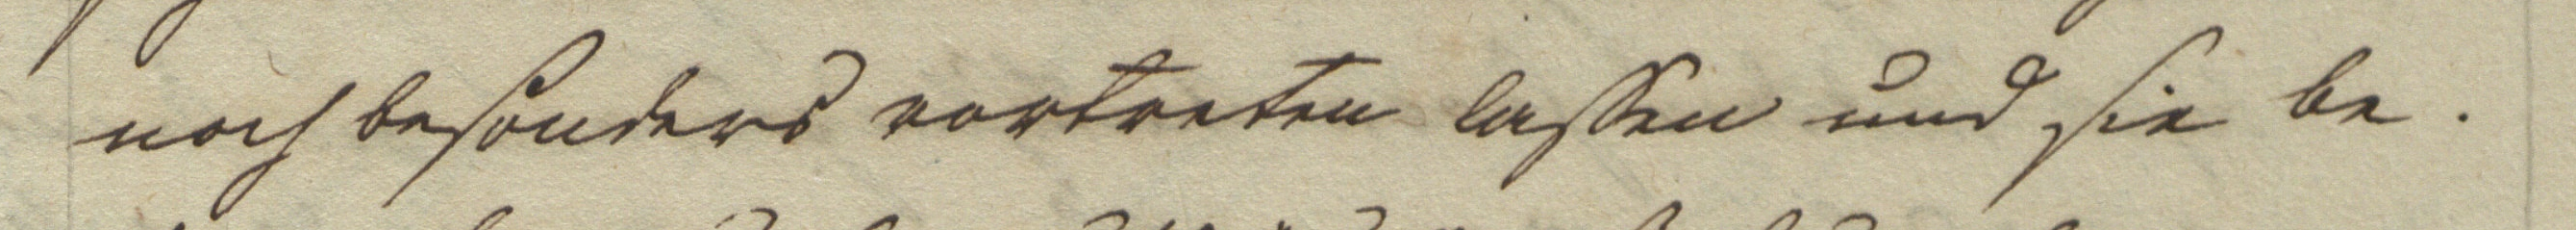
noch besonders vortreten lassen und sie be¬
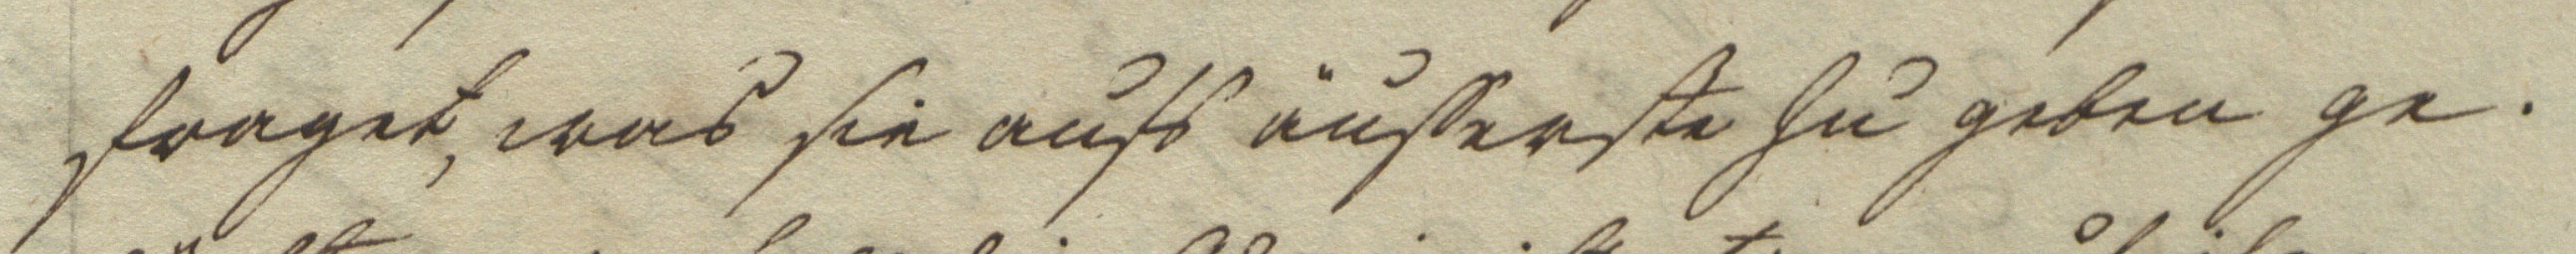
fraget, was sie aufs äusserste zu geben ge¬
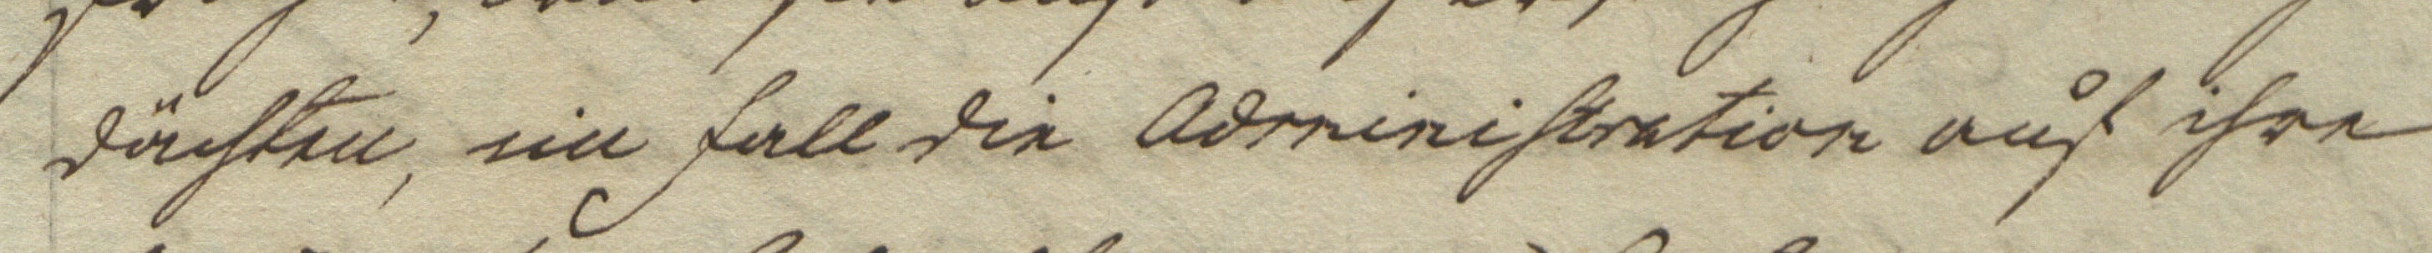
dächten, im Fall die Administration auf ihre
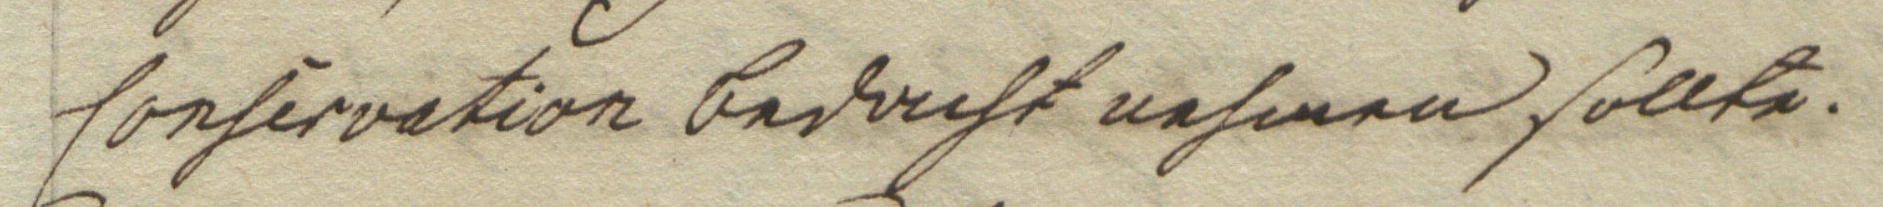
Conservation Bedacht nehmen sollte.
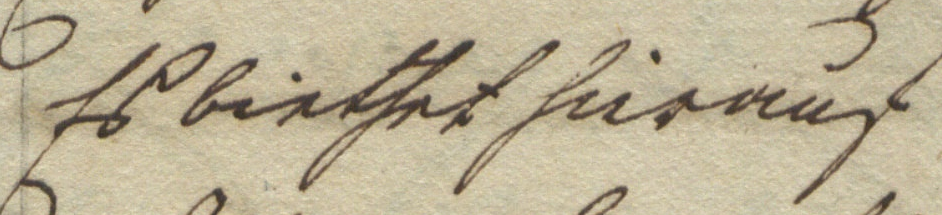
Es biethet hierauf
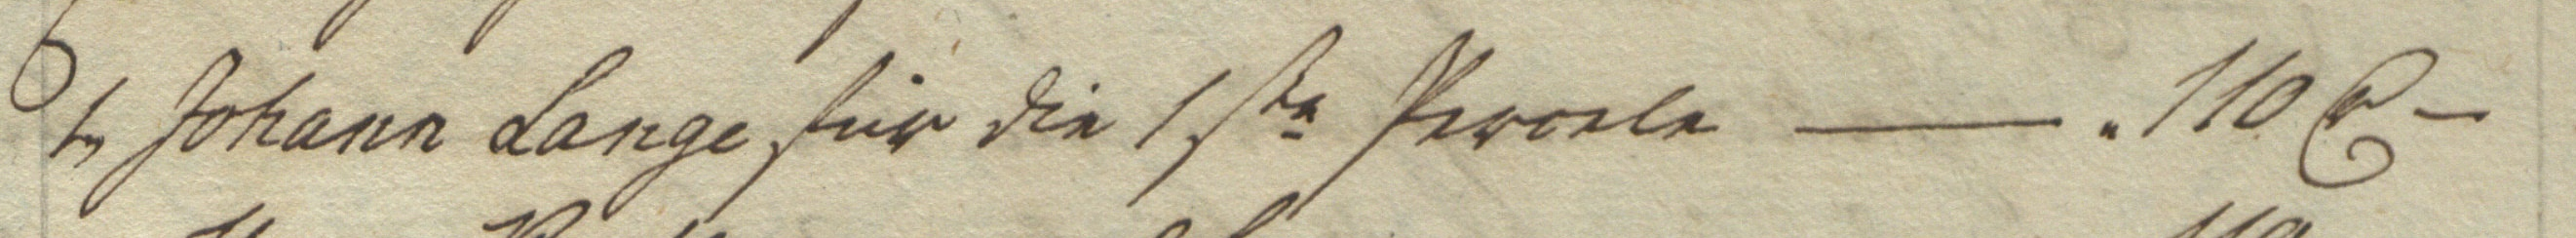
1., Johann Lange für die 1 ste Percele 110 l.
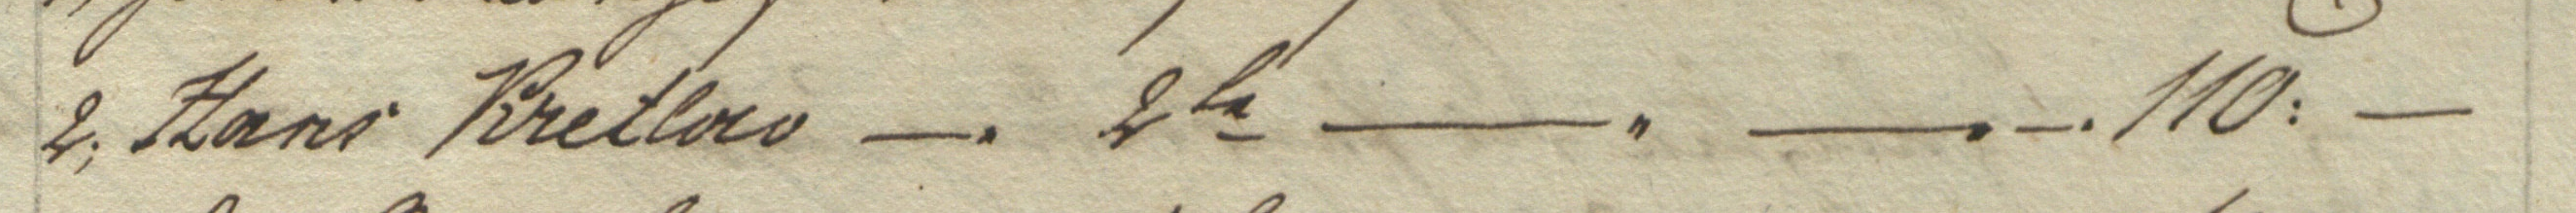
2., Hans Kretlow 2 te 110:
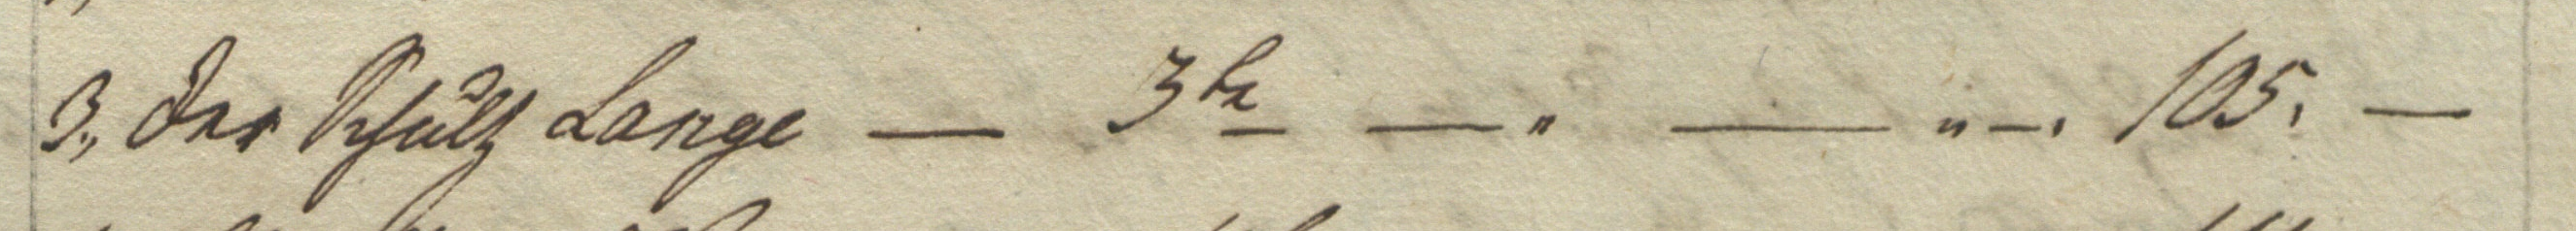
3., der Schulz Lange 3 te 105:
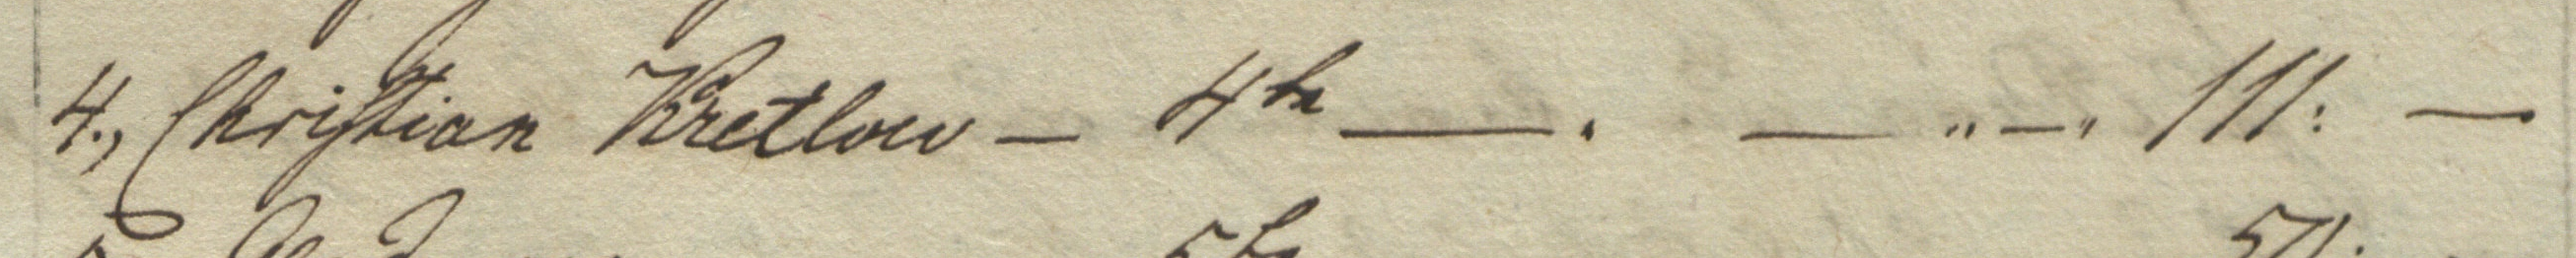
4., Christian Kretlow 4 te 111:
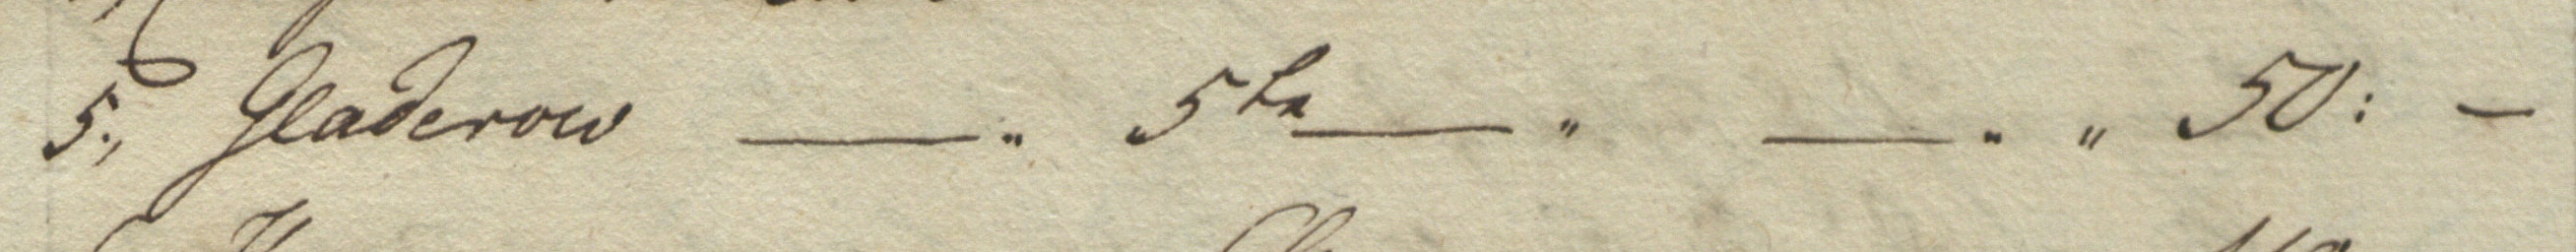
5., Gladerow 5 te 50:
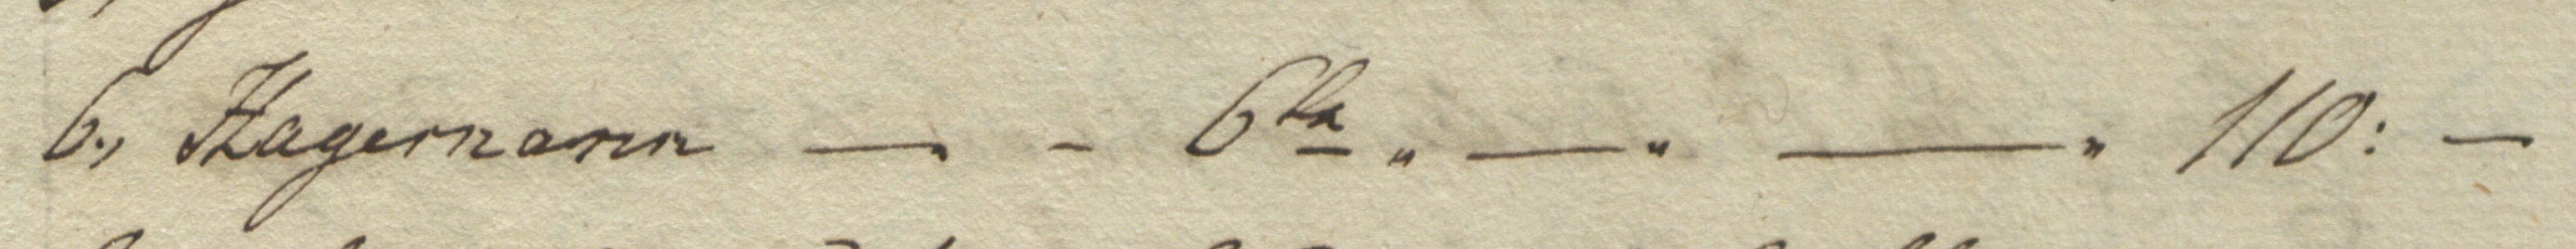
6., Hagemann 6 te 110:
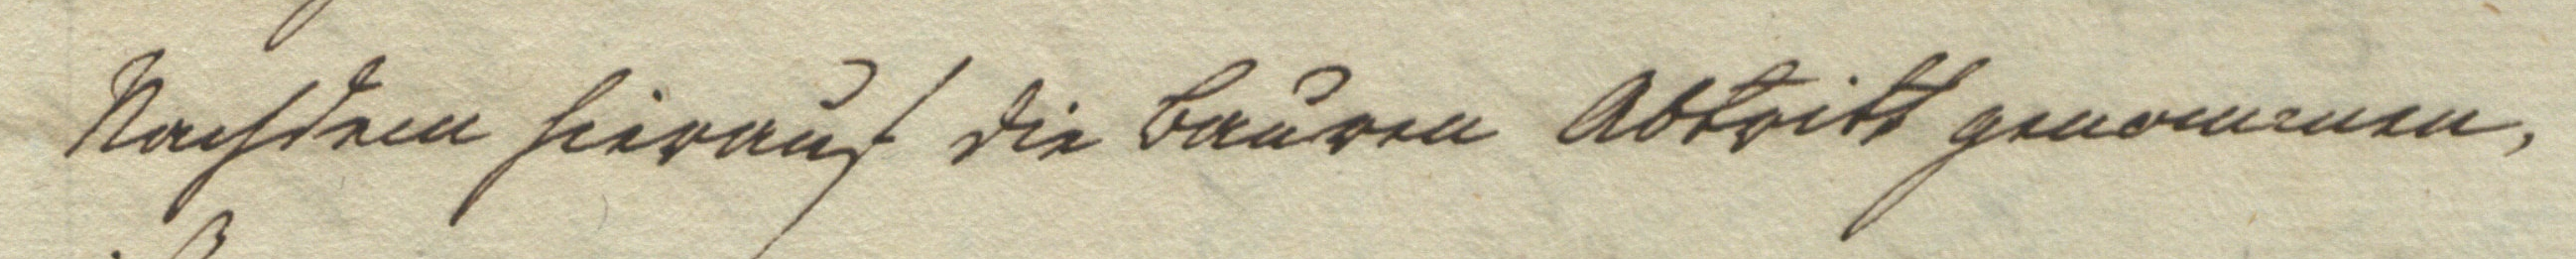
Nachdem hierauf die Bauren Abtritt genommen,
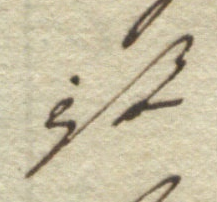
ist
